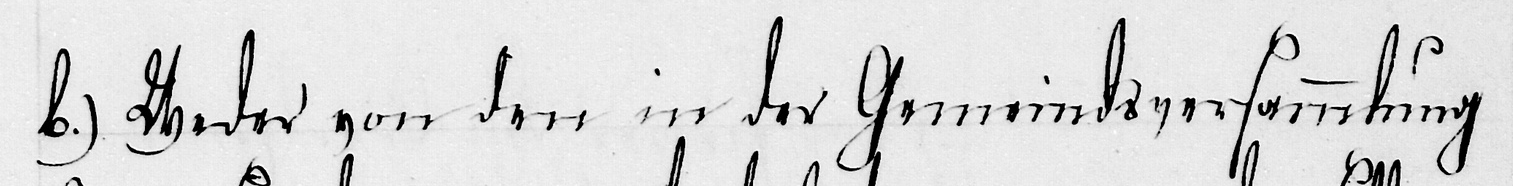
b.) Weder von den in der Gemeindsversammlung
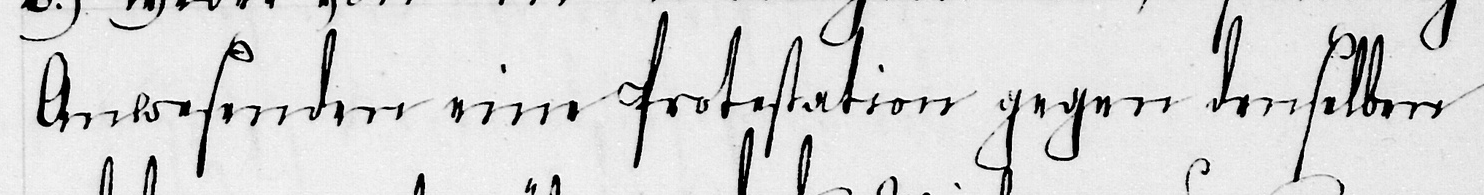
Anwesenden eine Protestation gegen denselben
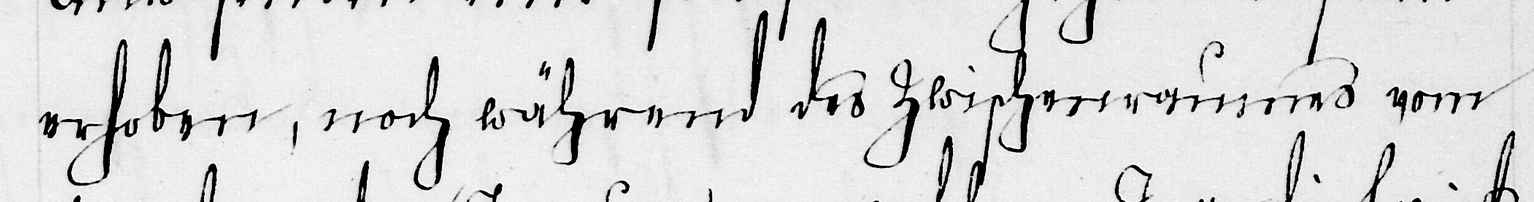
erhoben, noch während des Zwischenraumes vom
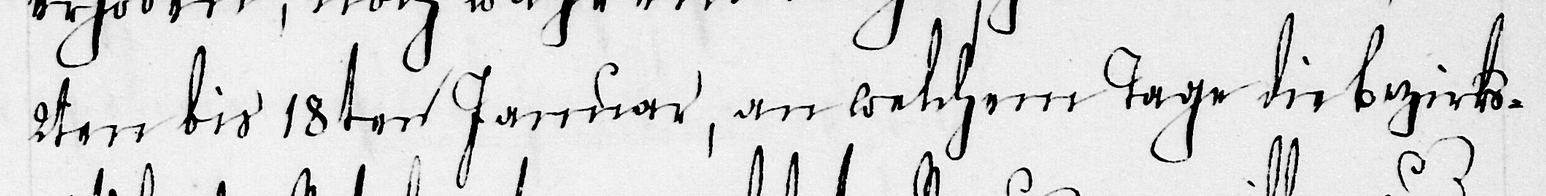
2ten bis 18ten Januar, an welchem Tage die bezirks¬
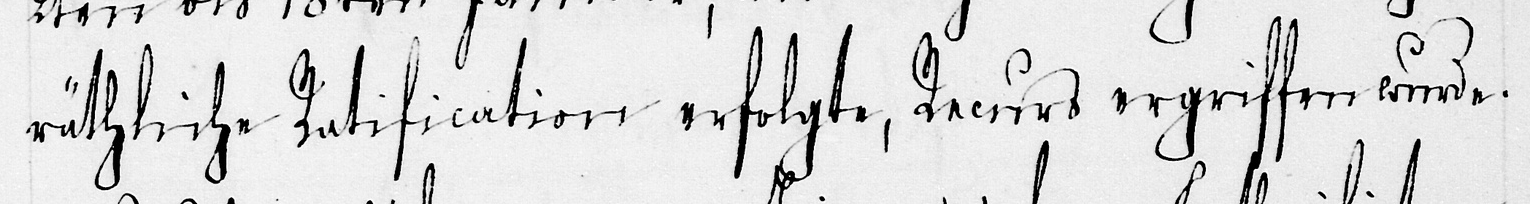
räthliche Ratification erfolgte, Recurs ergriffen wurde.
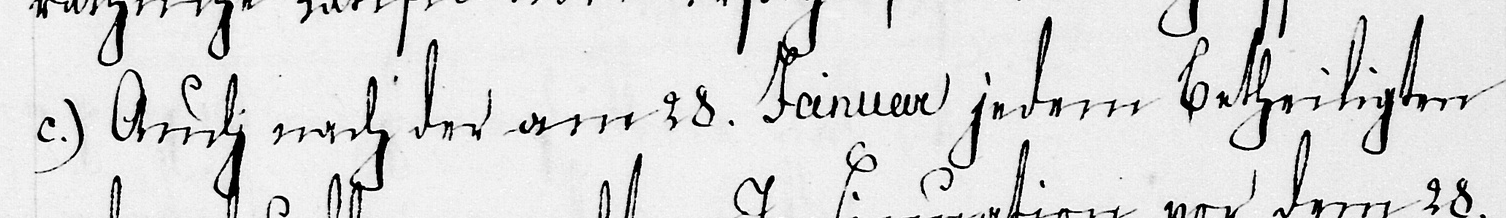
c.) Auch nach der am 28. Januar jedem Betheiligten
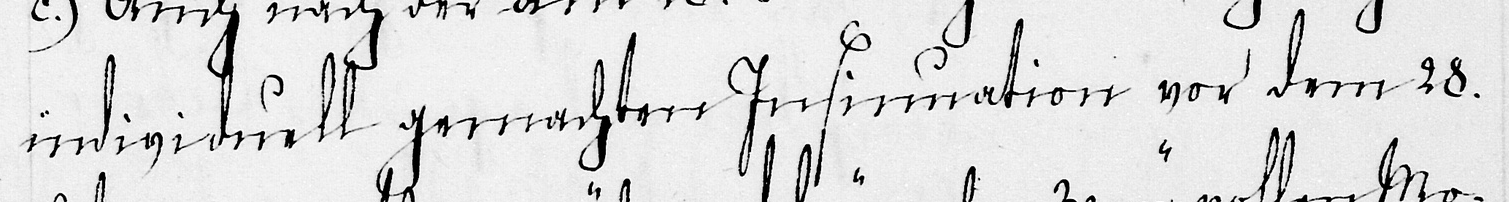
individuell gemachten Insinuation vor dem 28.
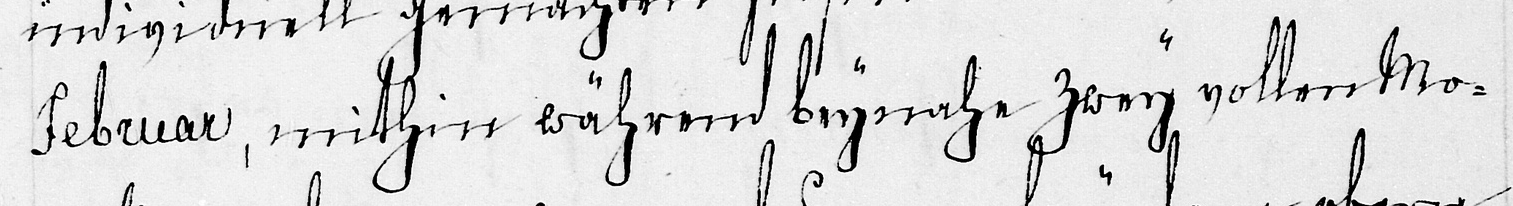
Februar, mithin während beynahe zwey vollen Mo¬
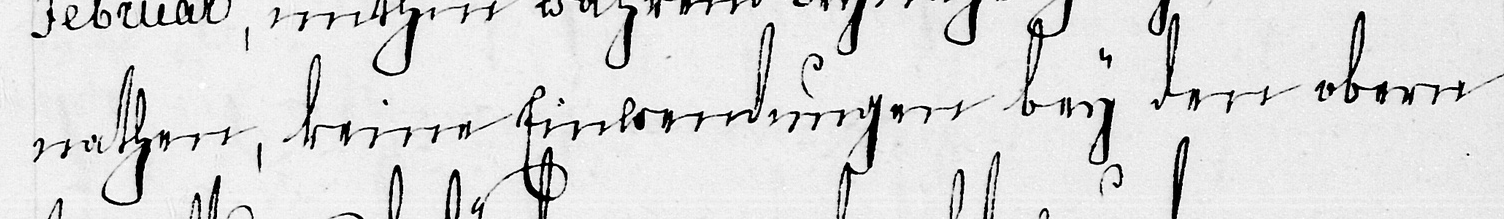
nathen, keine Einwendungen bey den obern
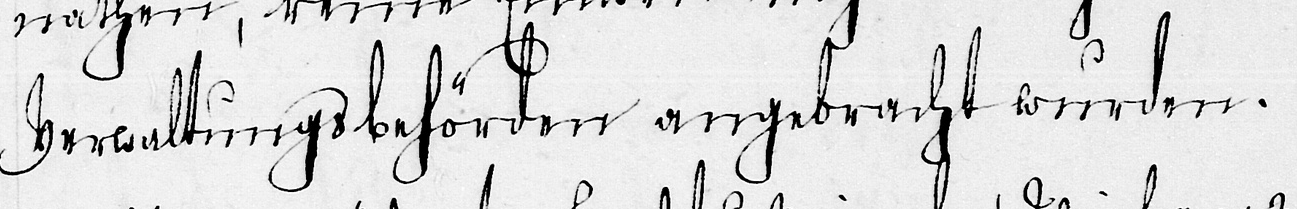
Verwaltungsbehörden angebracht wurden.
